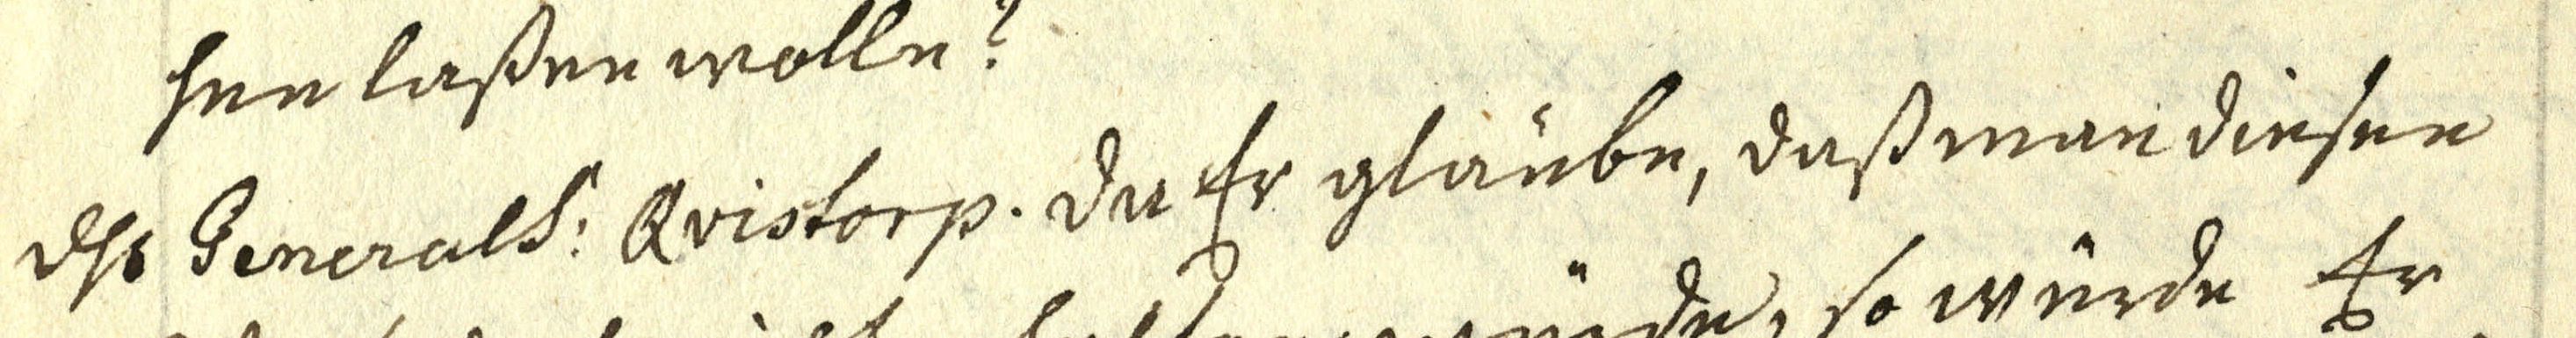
dh General. Quistorp. Da Er glaube, daß man diesen
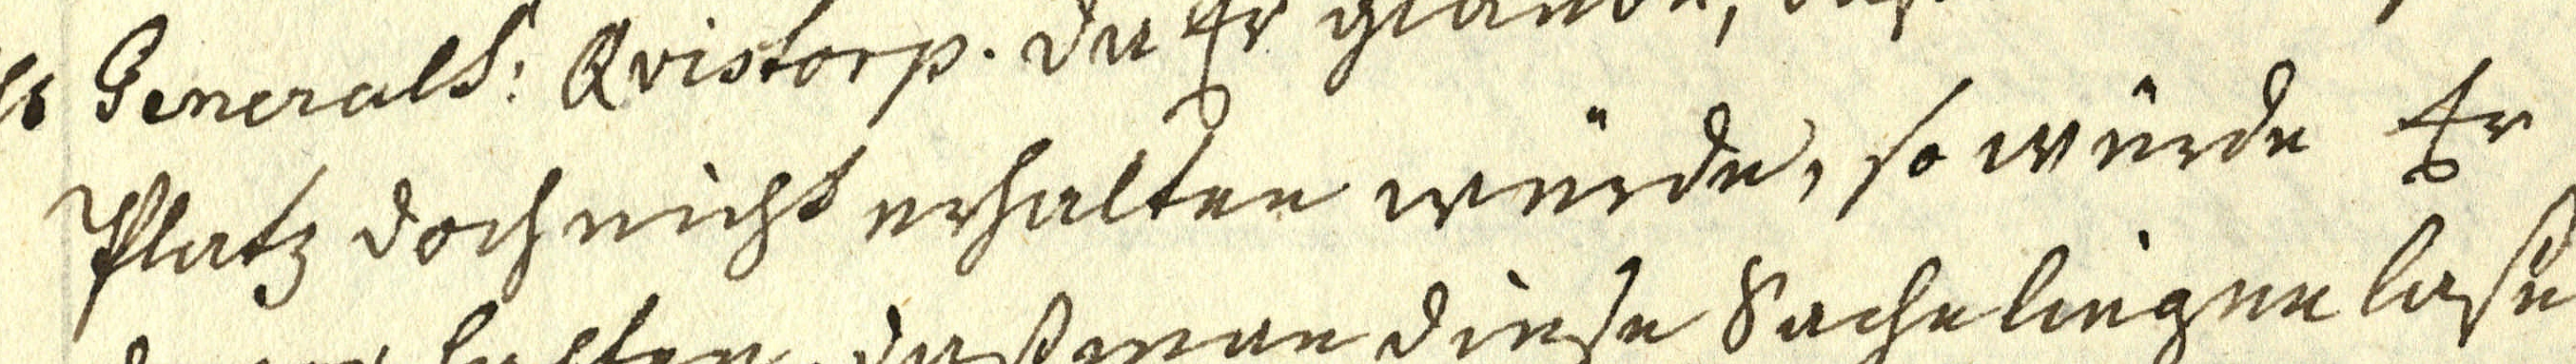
Platz doch nicht erhalten würde, so würde Er
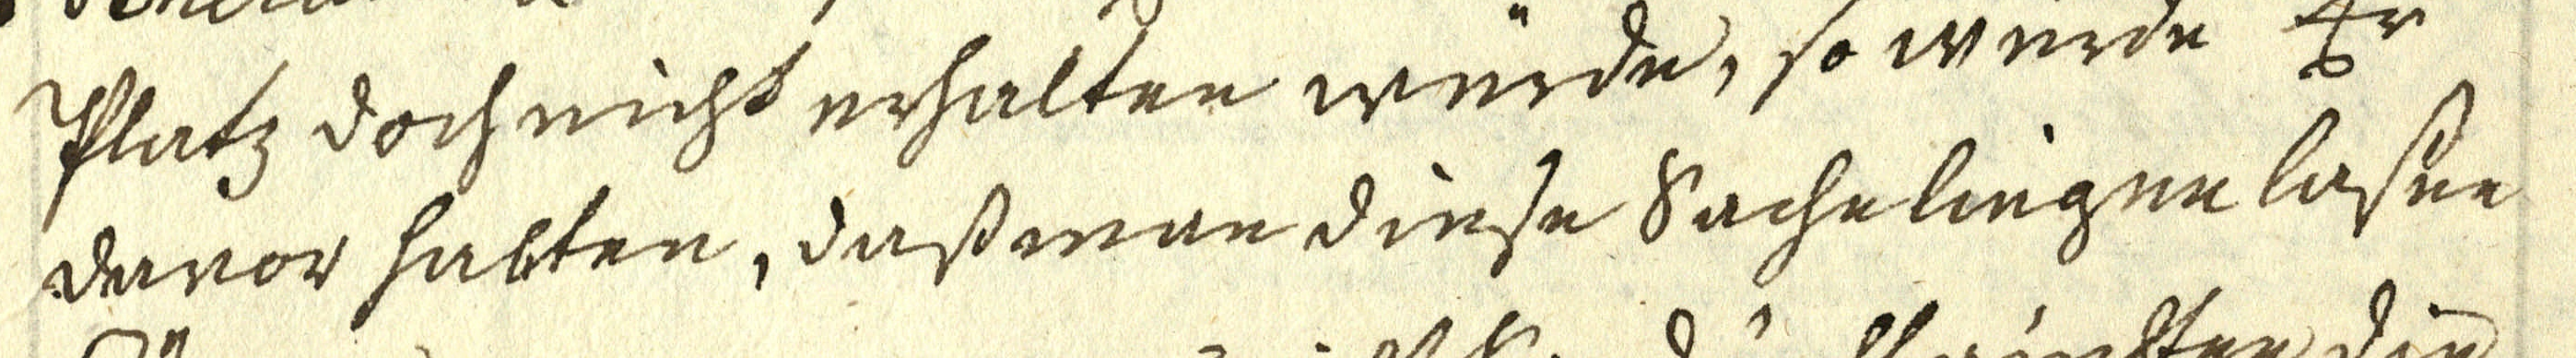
davor halten, daß man diese Sache liegen laßen
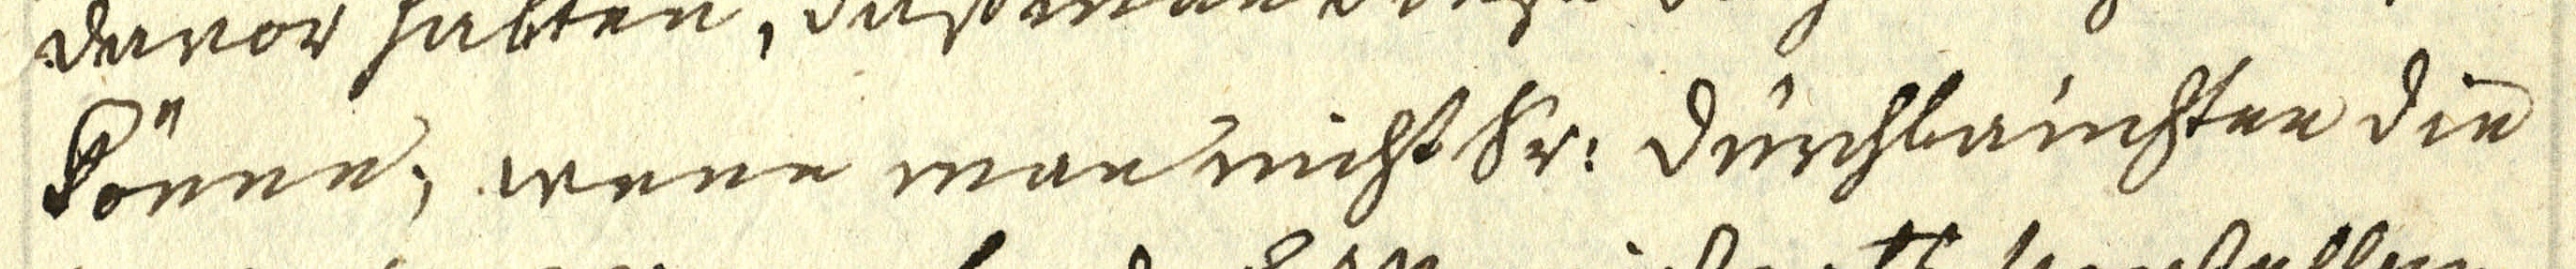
könne, wenn man nicht Sr Durchlauchten die
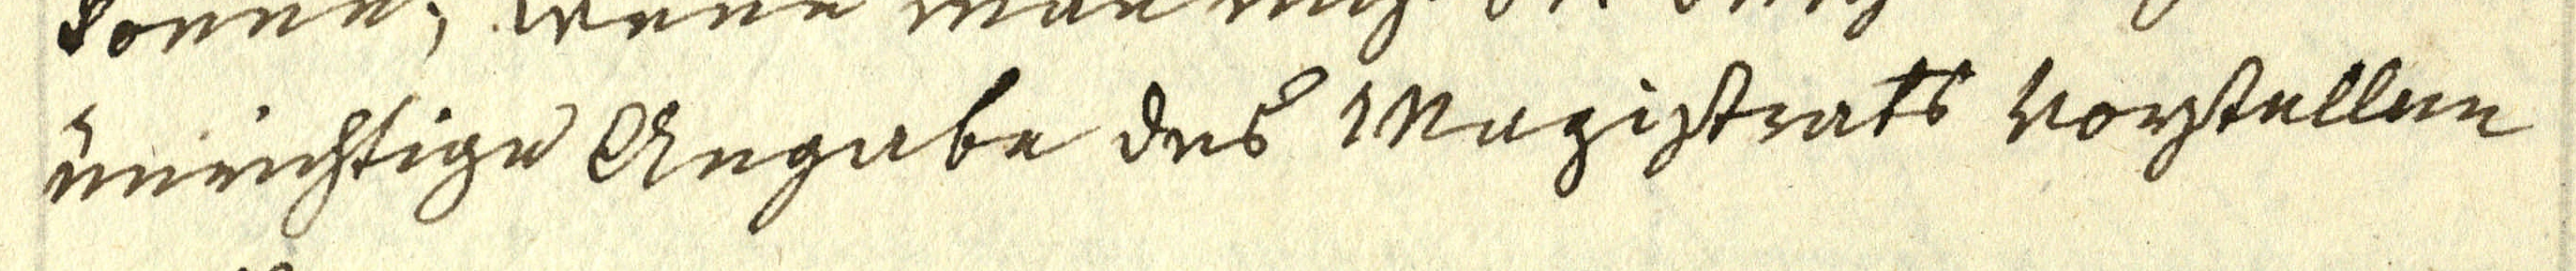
unrichtige Angabe des Magistrats vorstellen
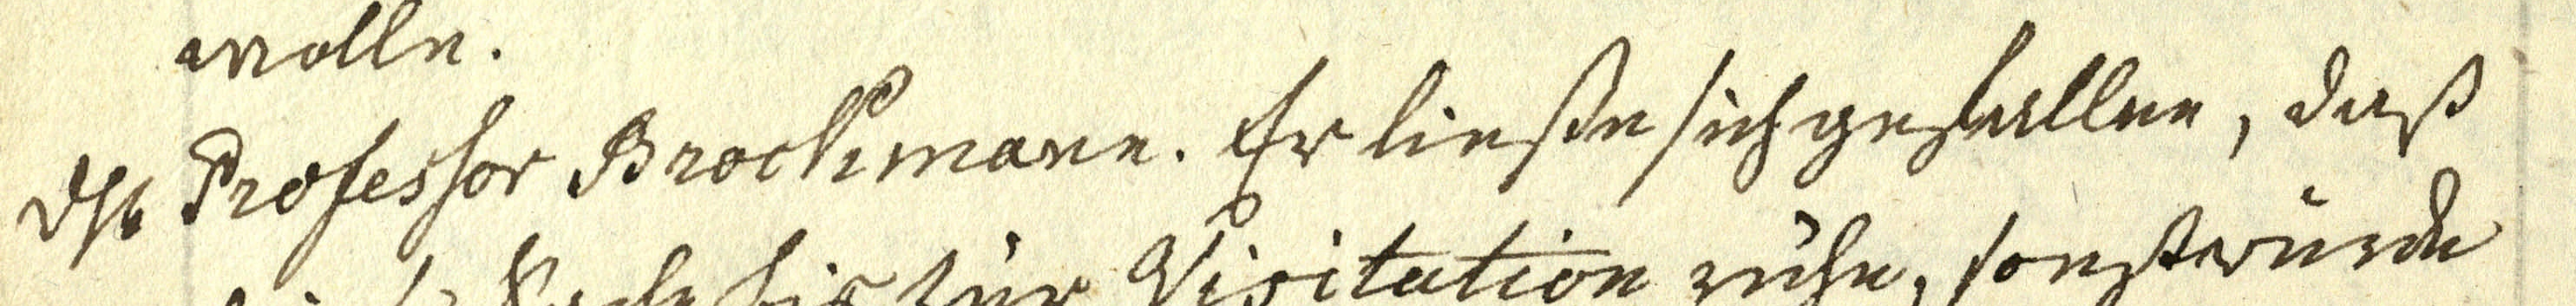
dh Professor Brockmann. Er ließe sich gefallen, daß
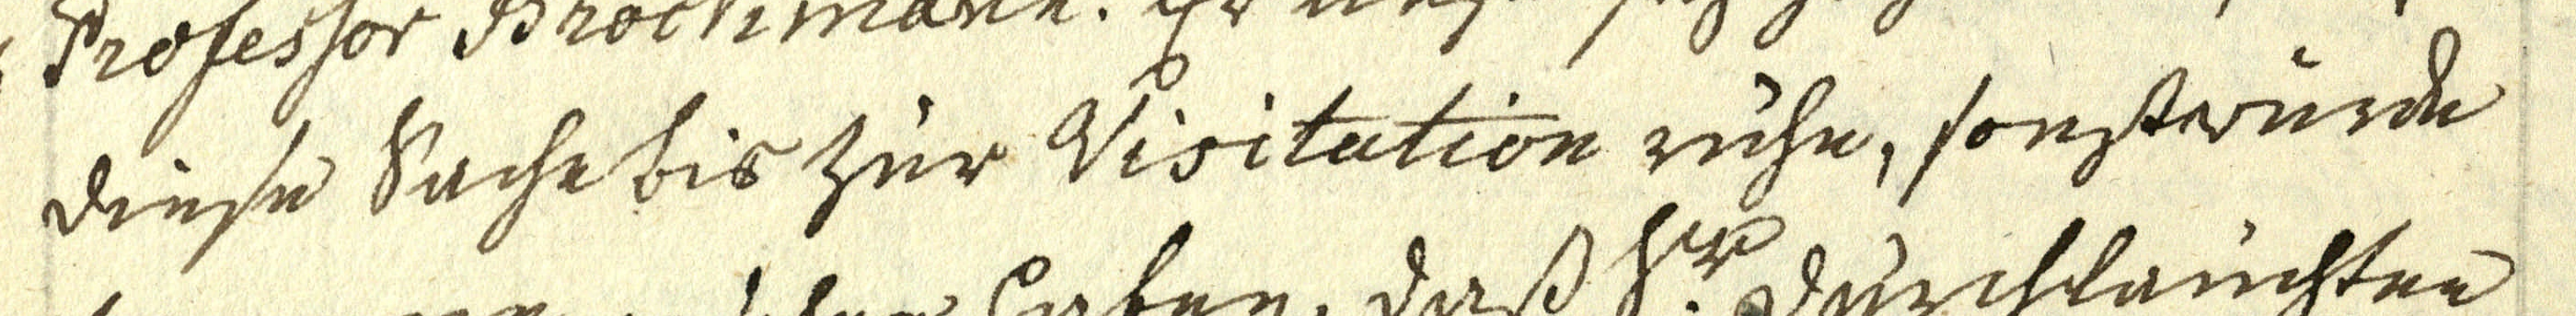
diese Sache bis zur Visitation ruhe, sonst würde
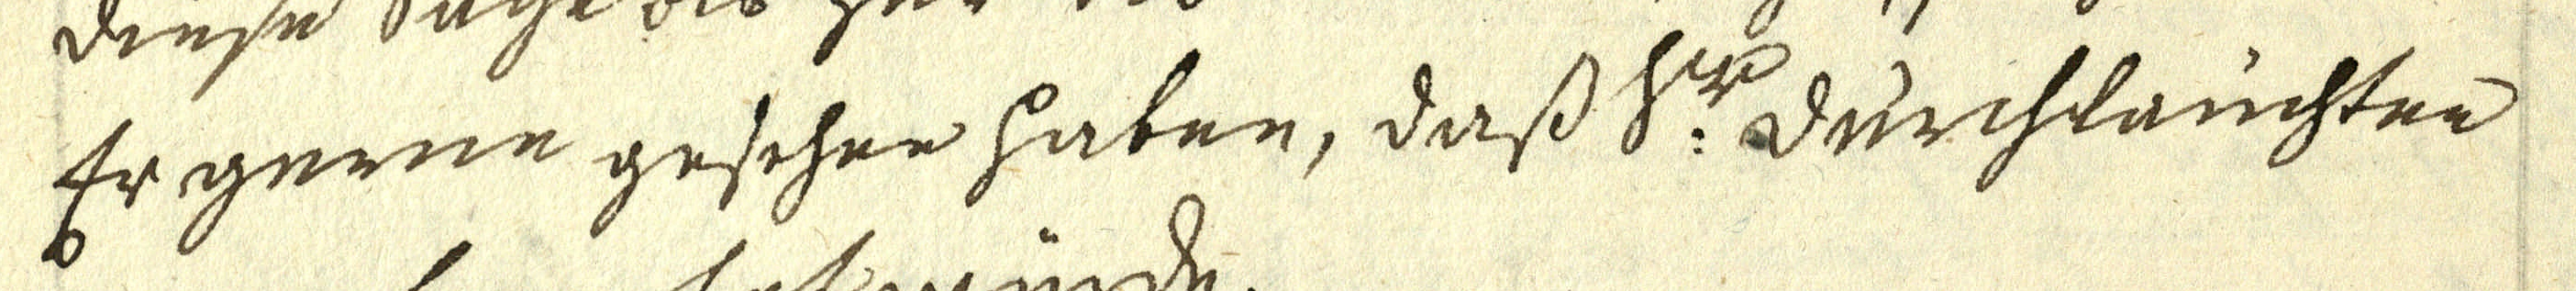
Er gerne gesehen haben, daß Sr Durchlauchten
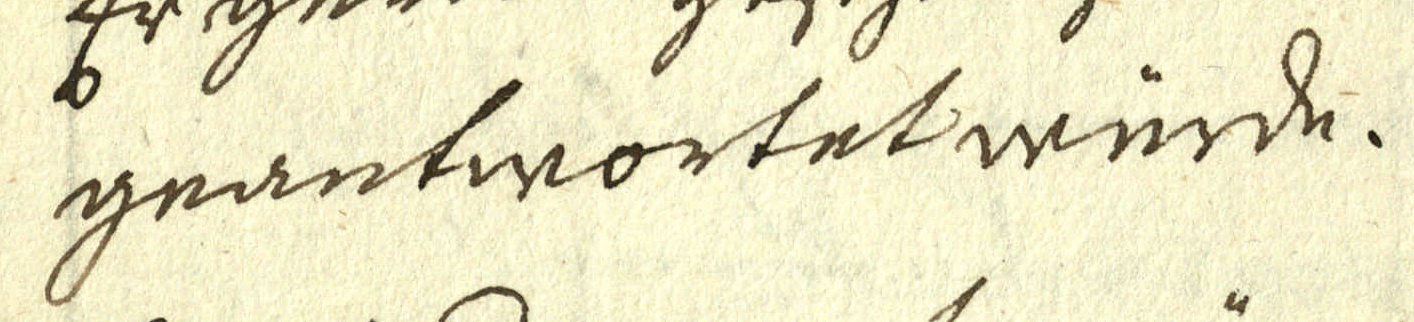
geantwortet würde.
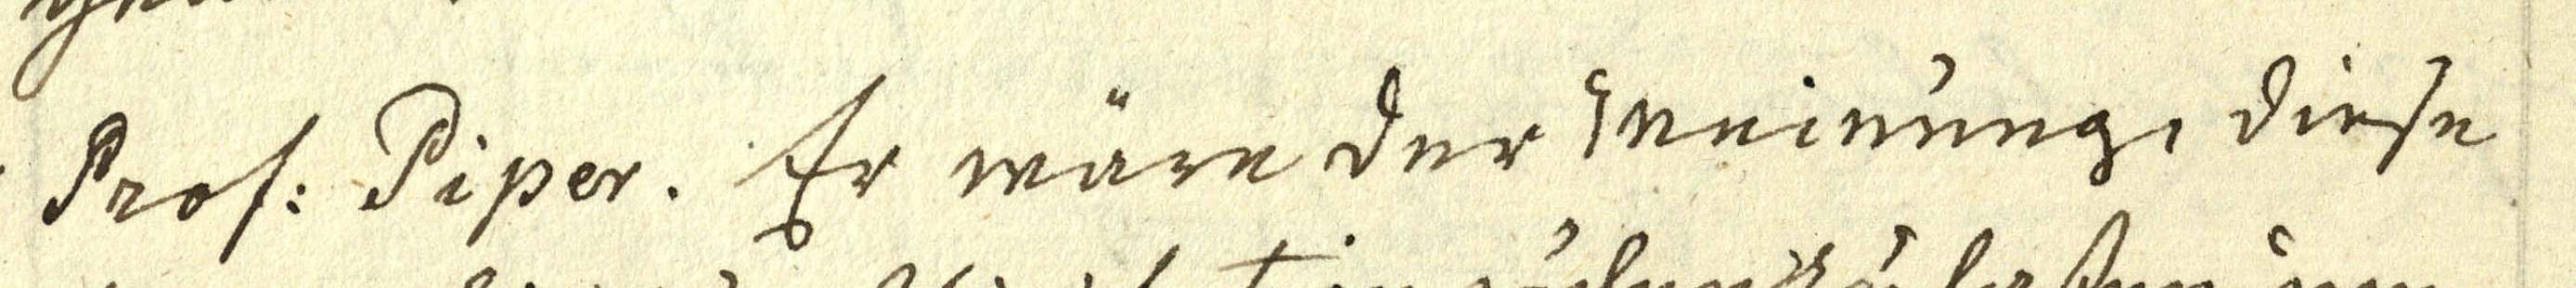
Prof. Piper. Er wäre der Meinung, diese
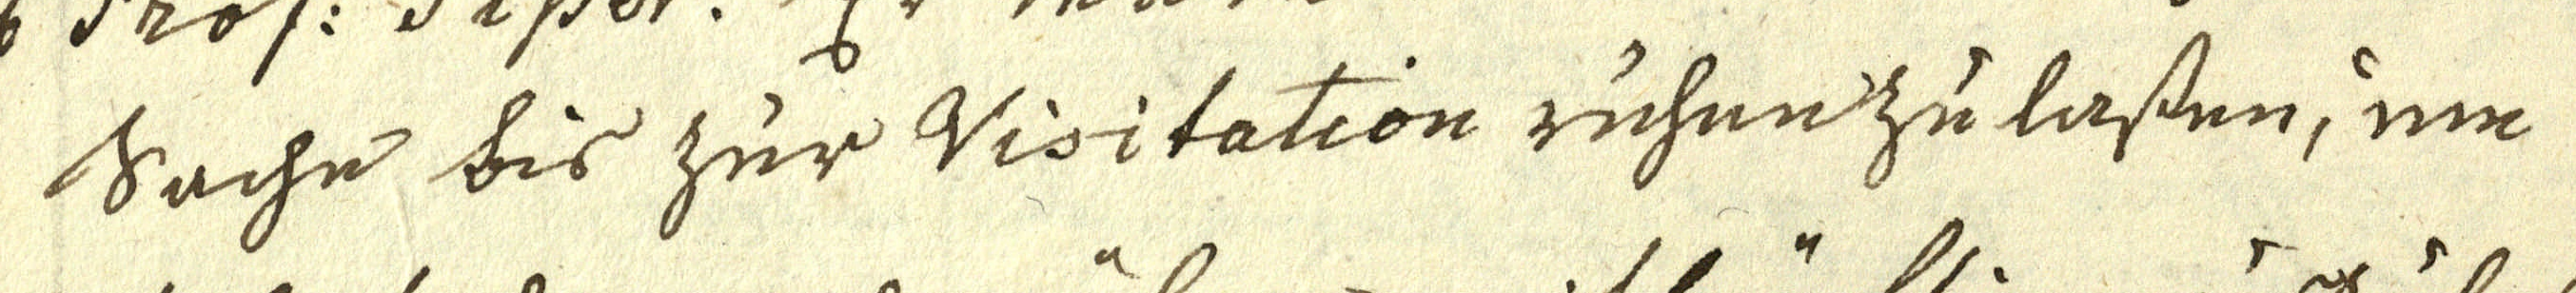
Sache bis zur Visitation ruhen zu laßen, um
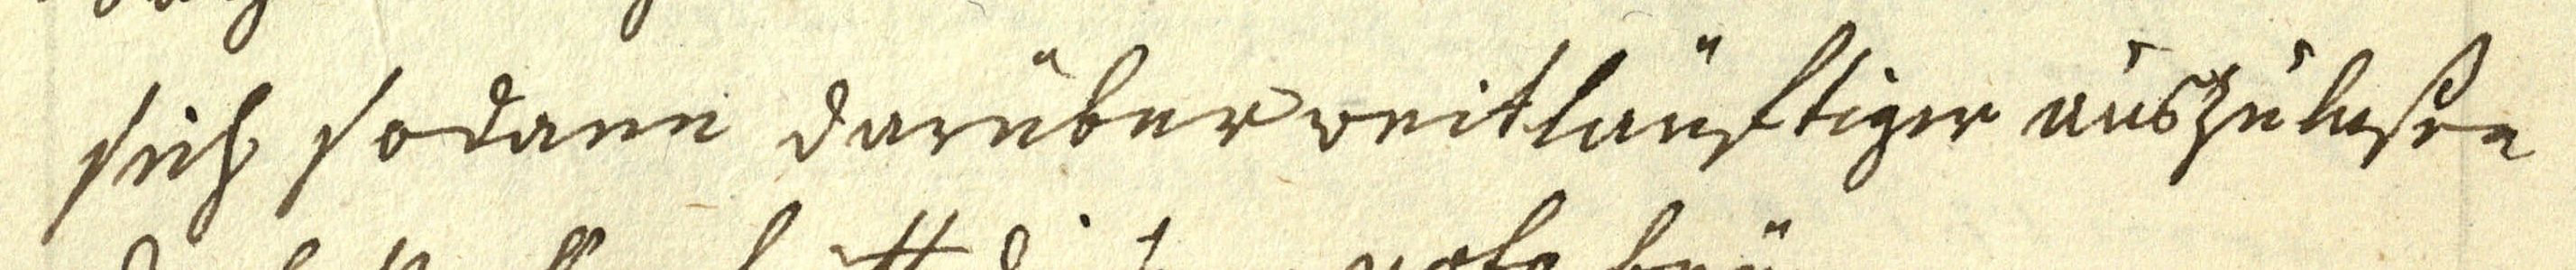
sich sodann darüber weitläuftiger auszulaßen
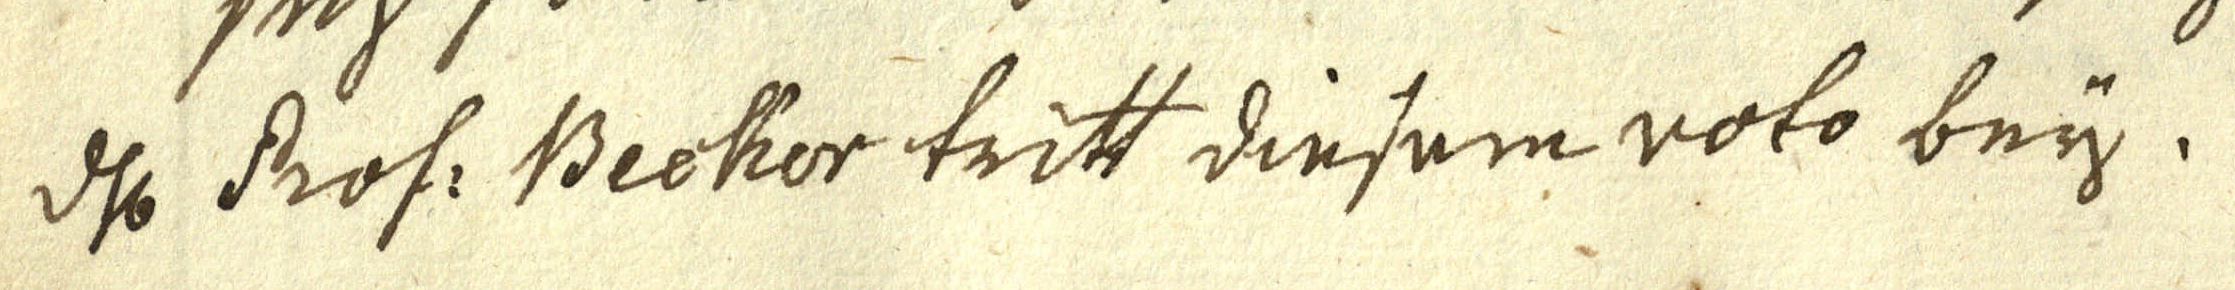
dh Prof. Becker tritt diesem voto beÿ.
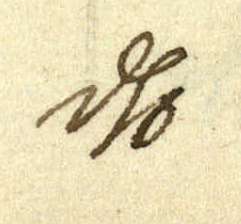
dh
